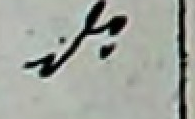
do
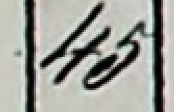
45
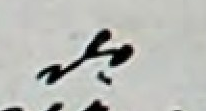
do
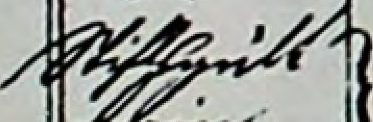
Stiftsgült
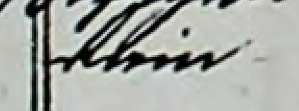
Rein
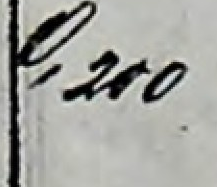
0,210
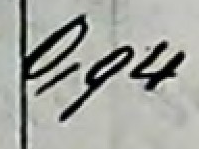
0,94
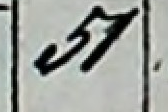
51
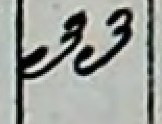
33
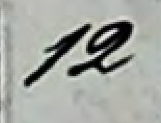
12
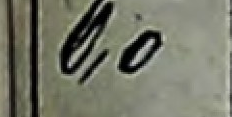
6,0
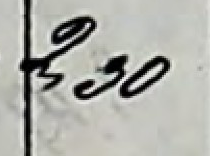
2,30
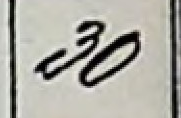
30
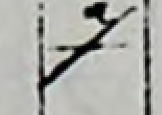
7
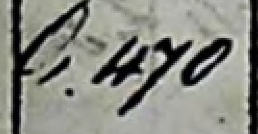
0,470
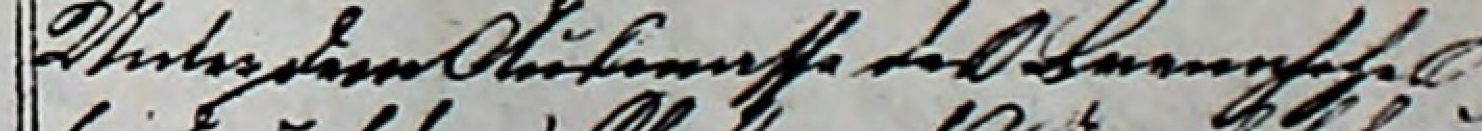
Unter dem Aubenasse des Brennholzes
